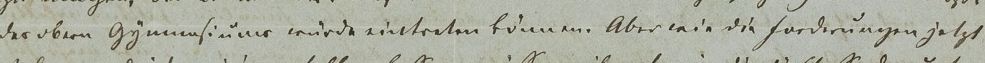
des obern Gymnasiums würde eintreten können. Aber wie die Forderungen jetzt
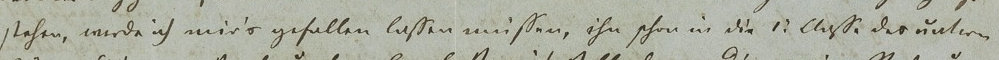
stehen, werde ich mir's gefallen lassen müssen, ihn schon in die 1te Classe des untern
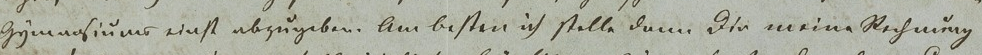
Gymnasiums einst abzugeben. Am besten ich stelle dann Dir meine Rechnung
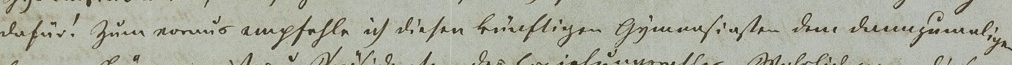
dafür! Zum voraus empfehle ich diesen künftigen Gymnasiasten dem dannzumaligen
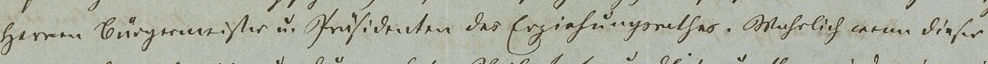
Herren Bürgermeister u. Präsidenten des Erziehungsrathes. Wahrlich wenn dieser
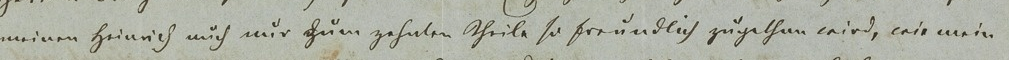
meinen Heinrich auch nur zum zehnten Theile so freundlich zugethan wird, wie mein
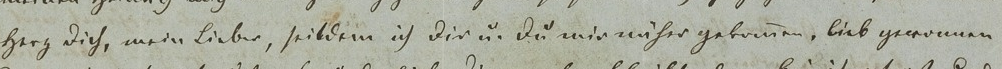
Herz Dich, mein Lieber, seitdem ich Dir u. Du mir näher gekommen, lieb gewonnen
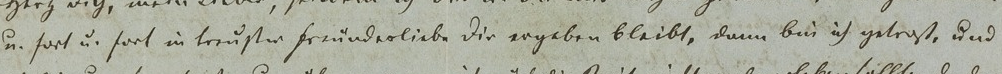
u. fort u. fort in treuster Freundesliebe Dir ergeben bleibt, dann bin ich getrost, und
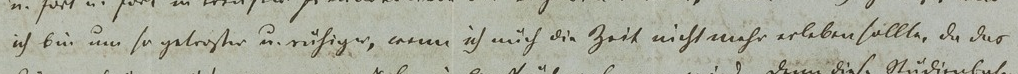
ich bin um so getroster u. ruhiger, wenn ich auch die Zeit nicht mehr erleben sollte, da das
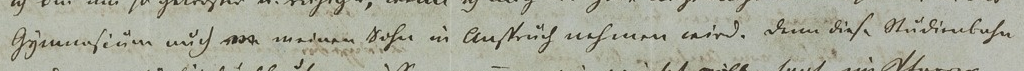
Gymnasium auch ...meinen Sohn in Anspruch nehmen wird. Denn diese Studienbahn
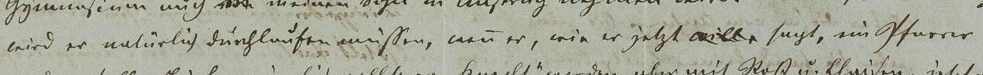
wird er natürlich durchlaufen müssen, wenn er, wie er jetzt will, sagt, ein Pfarrer
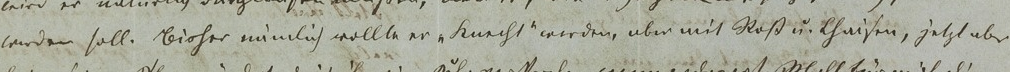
werden soll. Bisher nämlich wollte er «Knecht» werden, aber mit Roß u. Chaisen, jetzt aber
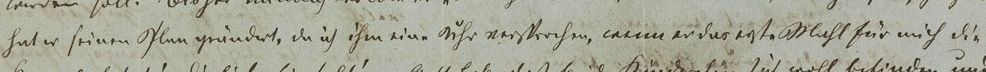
hat er seinen Plan geändert, da ich ihm eine Uhr versprochen, wenn er das erste Mahl für mich die
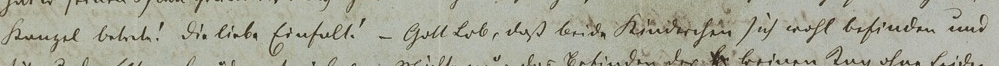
Kanzel betrete! Die liebe Einfalt! – Gott Lob, daß beide Kinderchen sich wohl befinden und
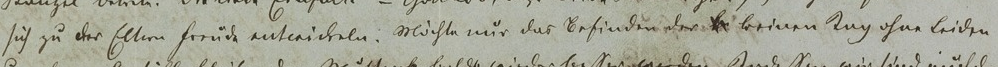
sich zu der Eltern Freude entwickeln. Möchte nur das Befinden der kr keinen Tag ohne Leiden
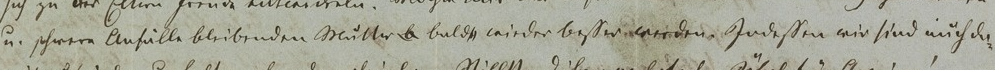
u. schwere Anfälle bleibenden Mutterb balde wieder besser werden. Indessen wir sind auch da-
